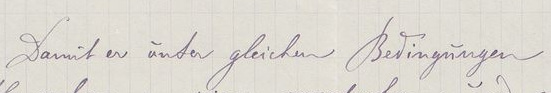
Damit er unter gleichen Bedingungen
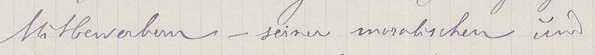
Mitbewerbern – seiner moralischen und materiellen
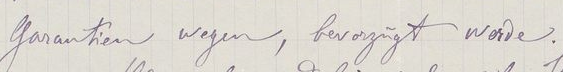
Garantien wegen, bevorzugt werde.
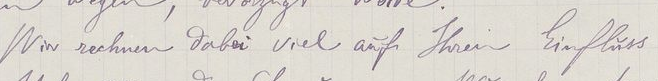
Wir rechnen dabei viel auf Ihren Einfluss
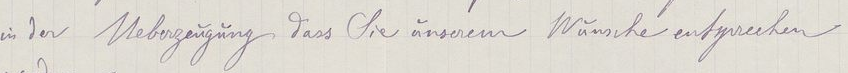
in der Überzeugung dass Sie unserem Wunsche entsprechen
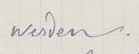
werden.
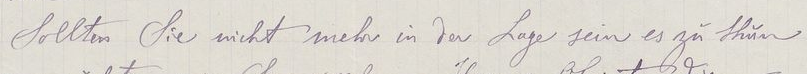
Sollten Sie nicht mehr in der Lage sein es zu thun
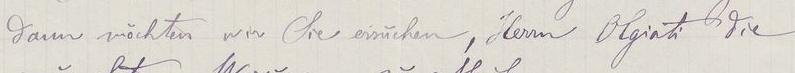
dann möchten wir Sie ersuchen, Herrn Olgiati die
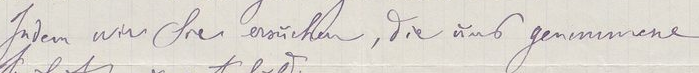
Indem wir Sie ersuchen, die uns genommene
